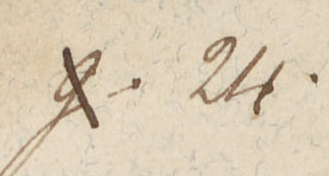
G. 24.
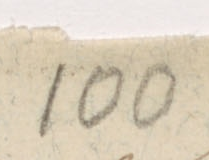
100
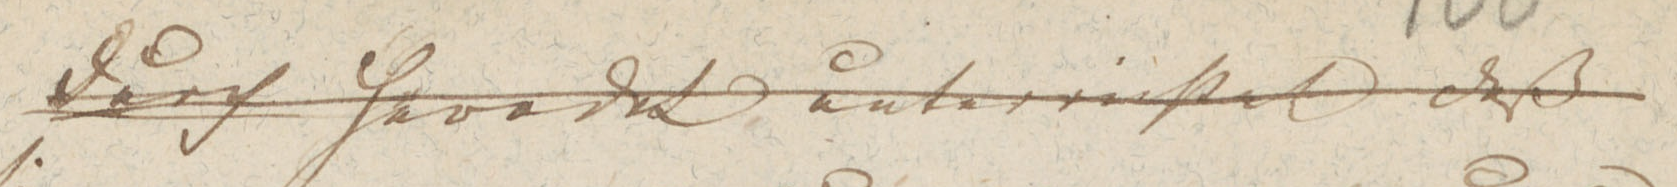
durch Herodot unterrichtet dass
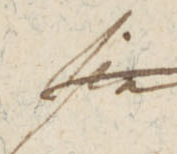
sie
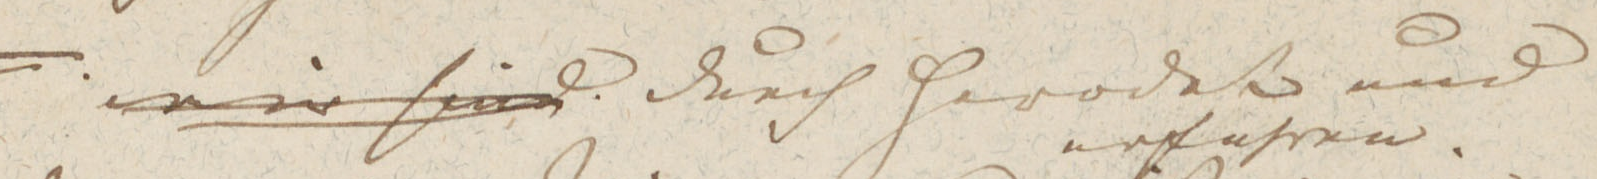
wir sind Durch Herodot und
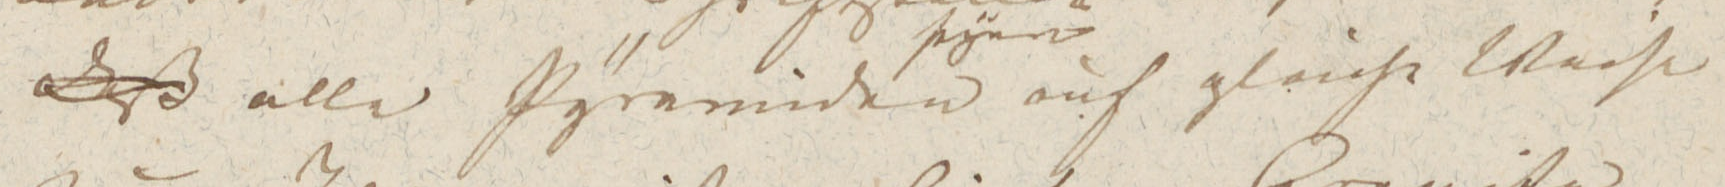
dass alle Pyramiden seyen auf gleiche Weise
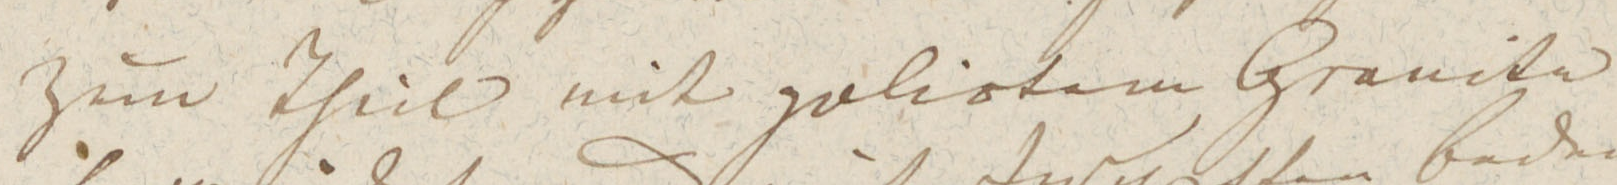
zum Theil mit polirtem Granite
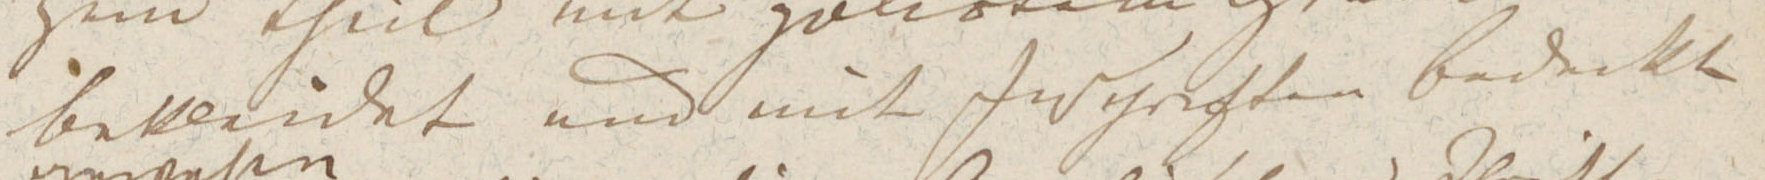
bekleidet und mit Inschriften bedeckt
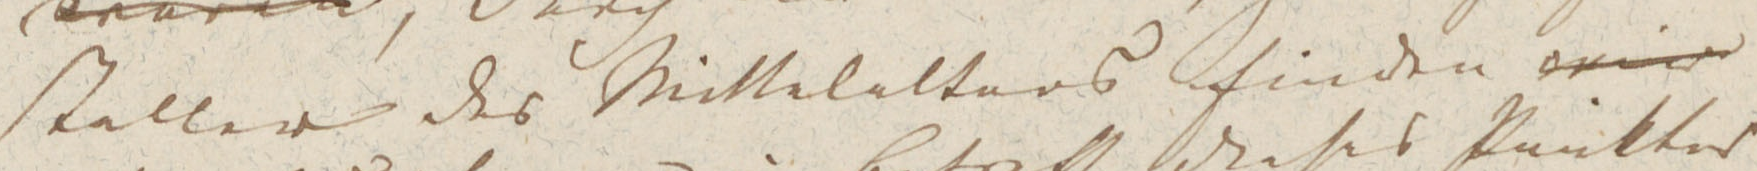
steller des Mittelalters finden wir
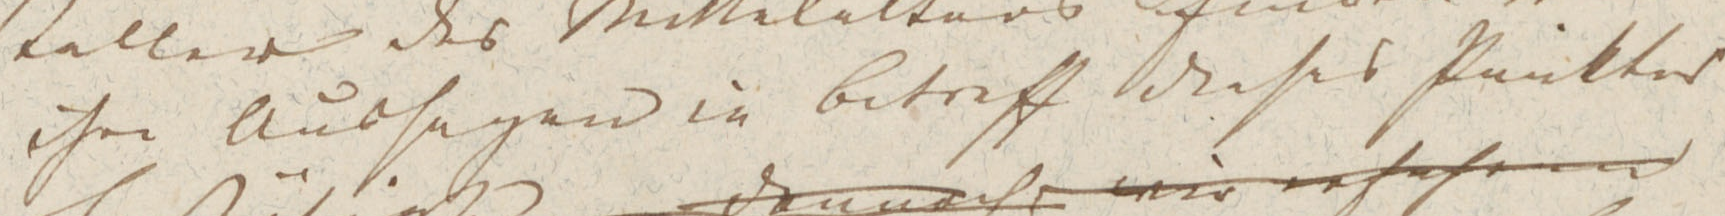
ihre Aussagen in betreff dieses Punktes
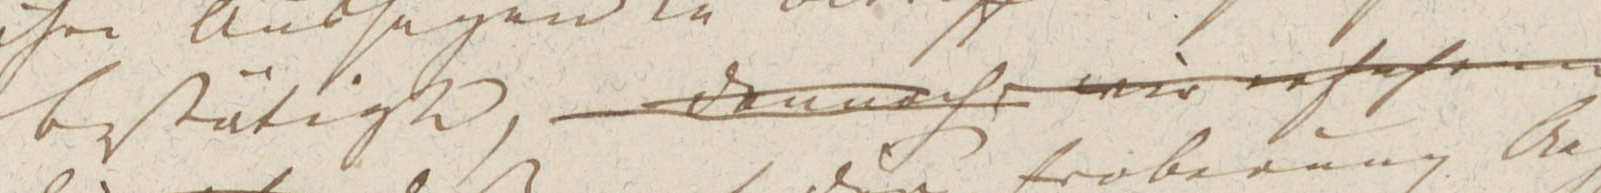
bestätigt, dennoch wir erfahren
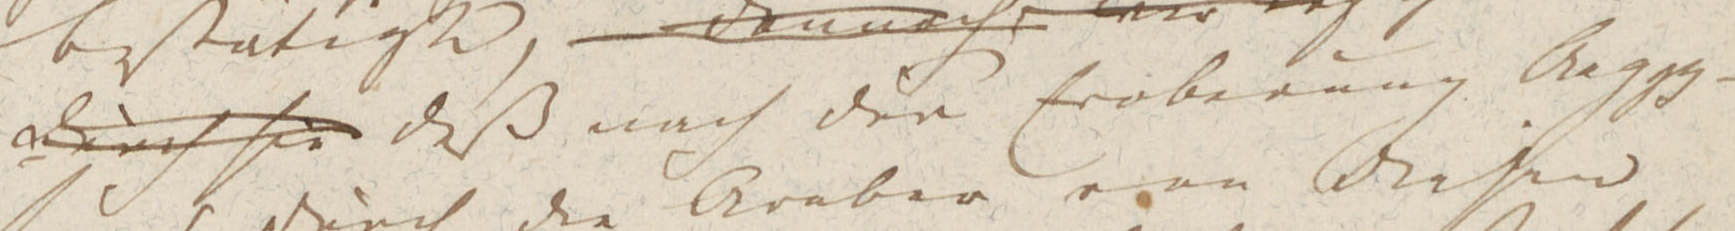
durch sie dass nach der Eroberung Aegyp-
